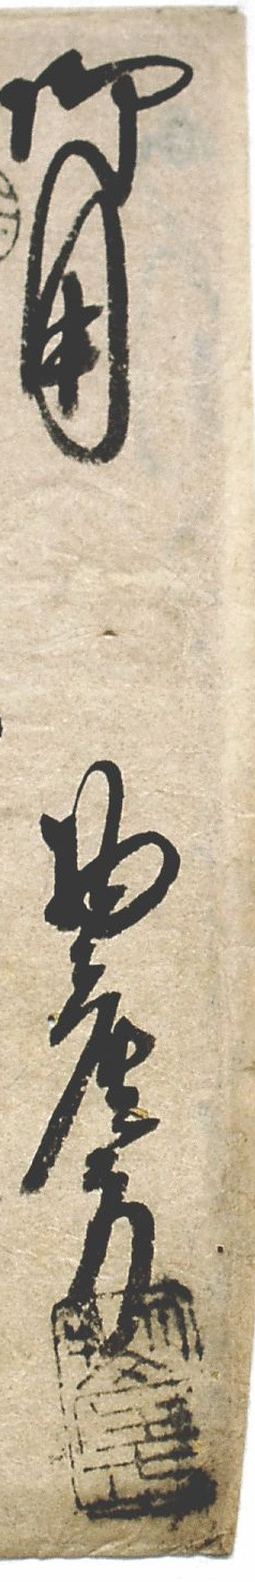御用物産方

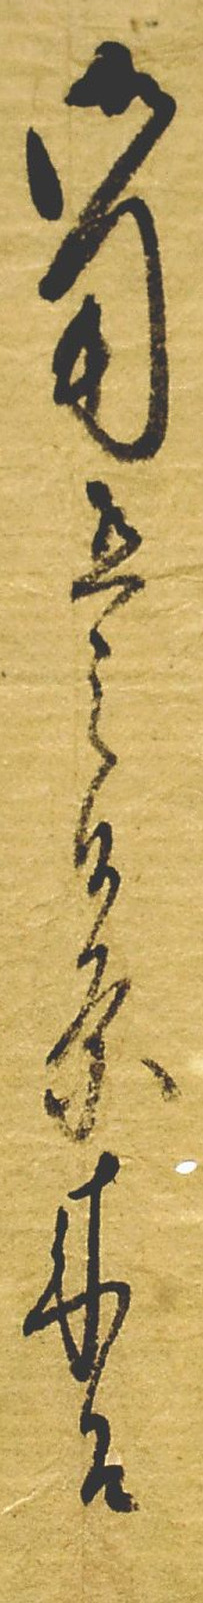御用有之候条来る
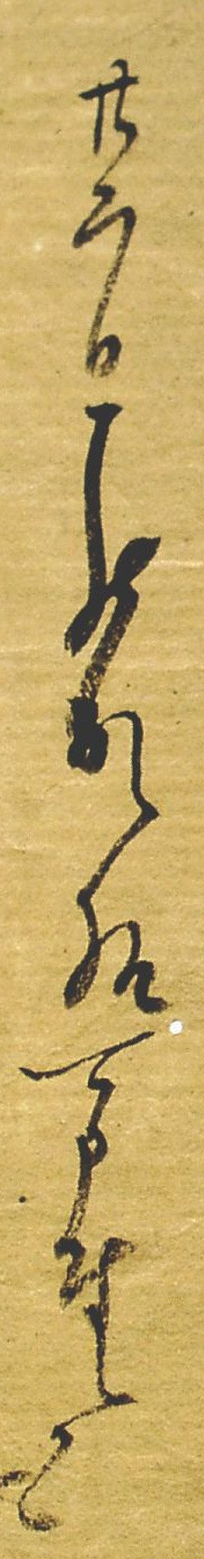廿二日罷出候様可申付候以上
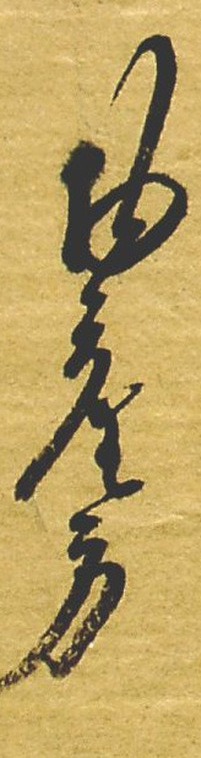物産方
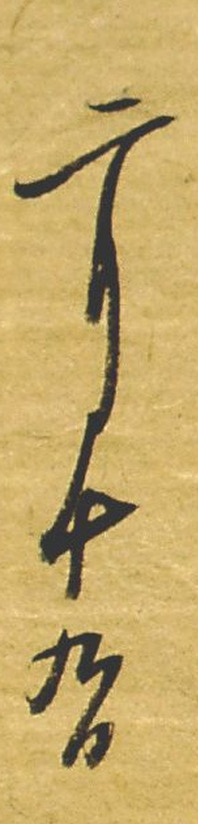二月十九日
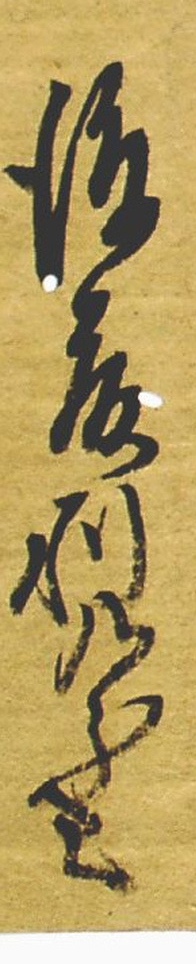後藤利八郎方へ

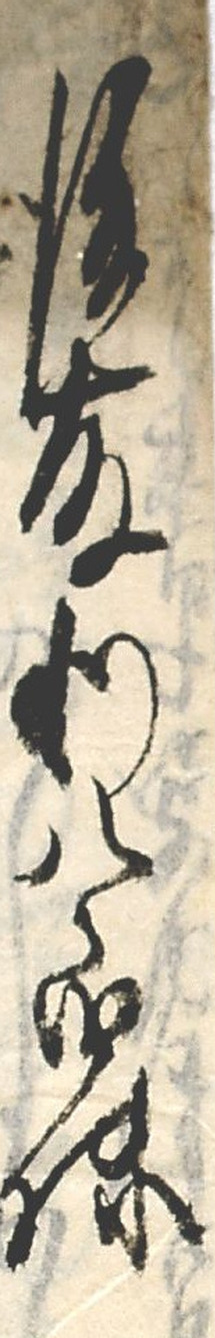後藤利八郎様
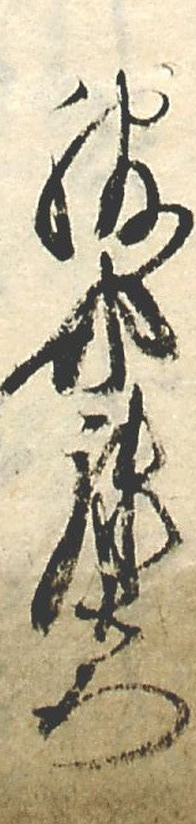服部康右衛門

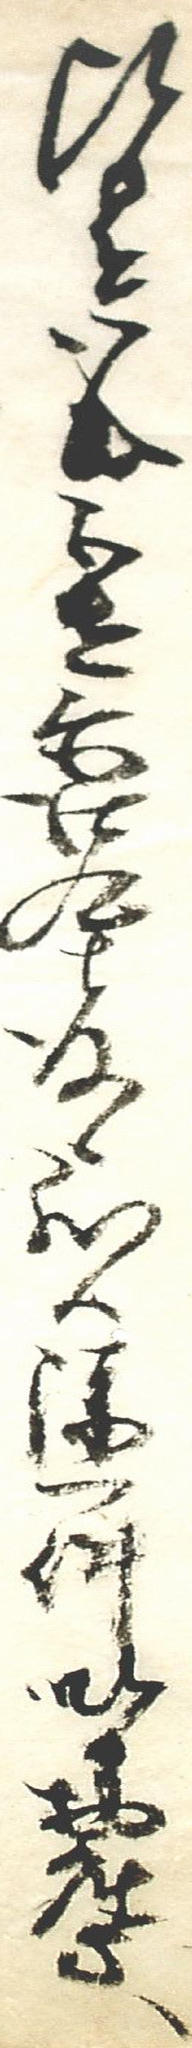頃日は御心被遣忝仕合奉存候然は漆一件昨日物産方へ
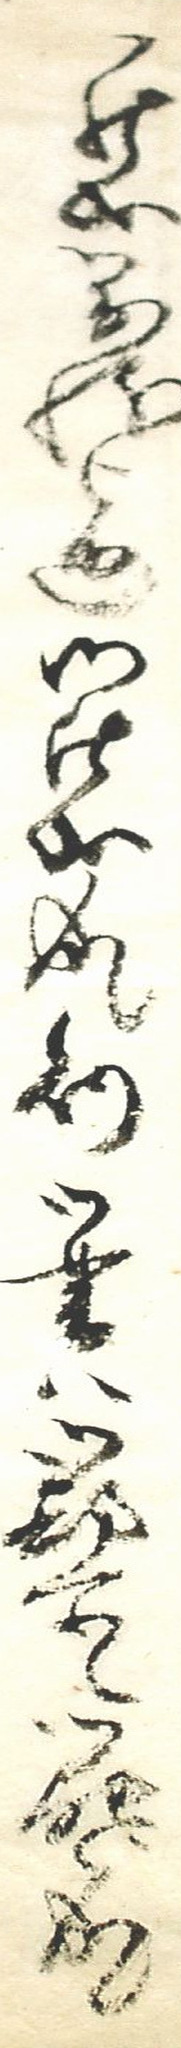罷出別紙之通御仕出成候則御書は御都所へ御配被成候
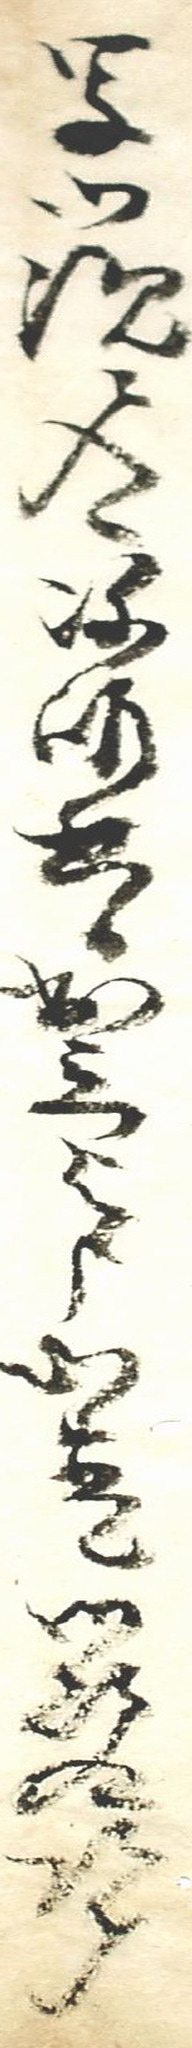写御覧に入候弥明六日出立と申出置候御都合次第
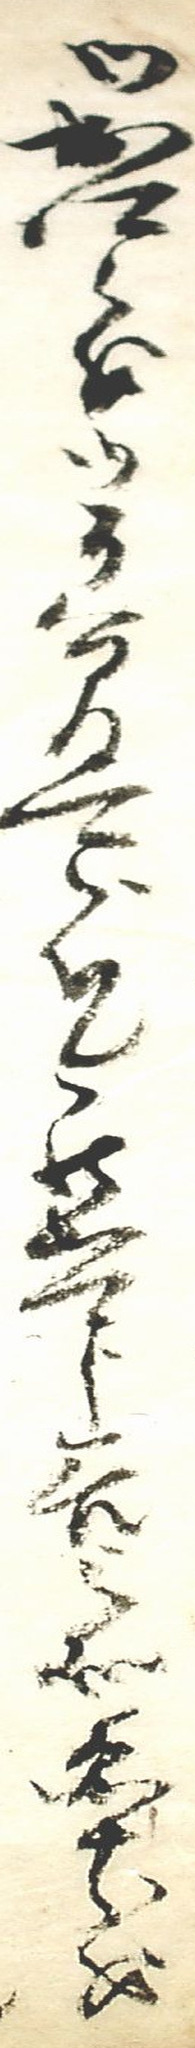御出郷之義御了簡可被下候罷出可申筈之処円十郎義
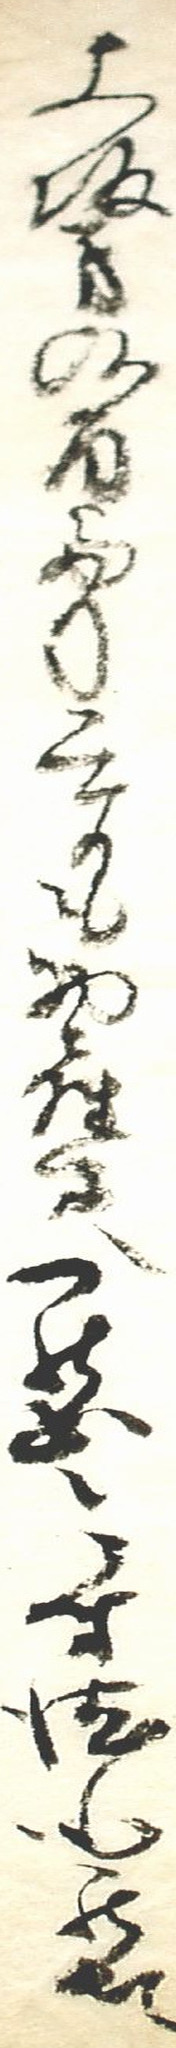上坂旁何角当月三日も物産方へ罷出候に付徳兵衛罷出可
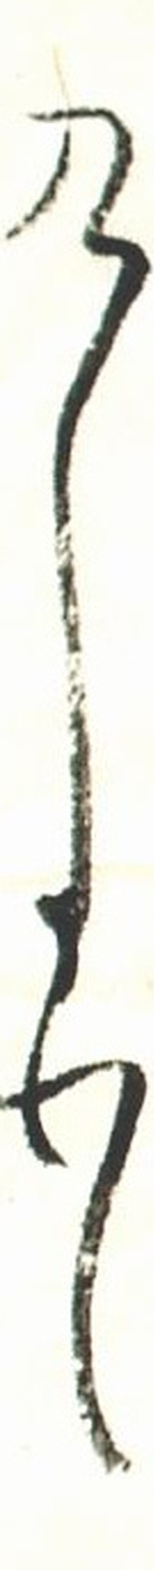九月五日
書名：口上（漆売捌きについて）
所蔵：鳴門教育大学 Naruto University of Education
